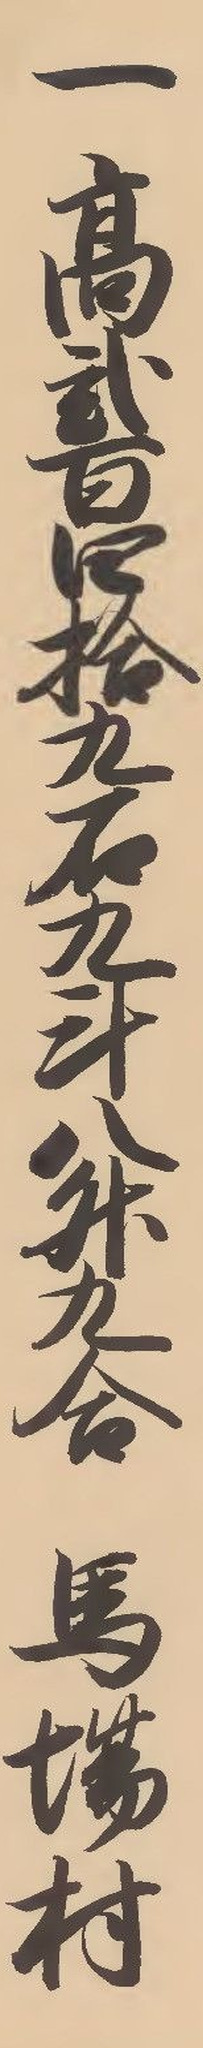一高弐百四拾九石九斗八外九合馬場村

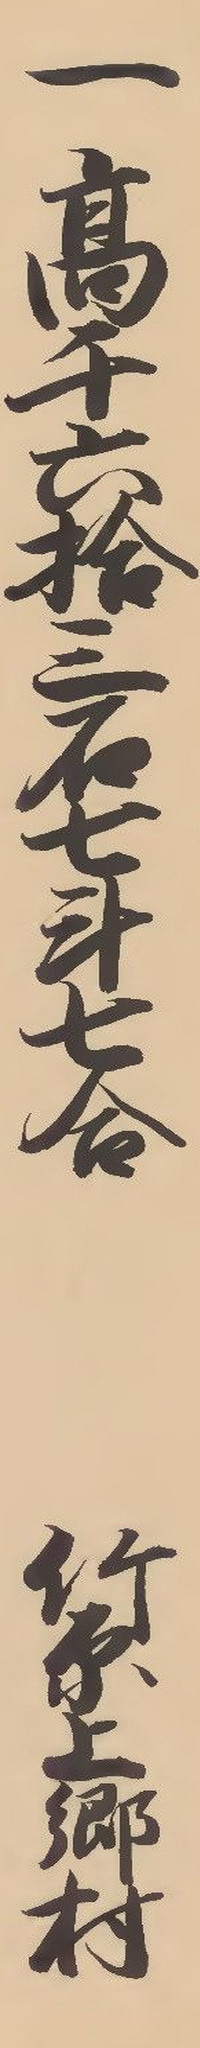一高千六拾三石七斗七合竹原上郷村
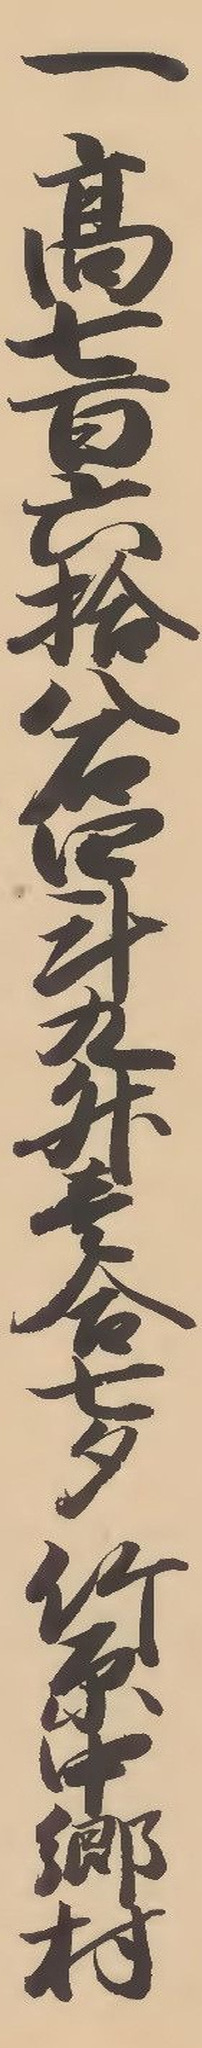一高七百六拾石八斗九升壱合七勺竹原中郷村
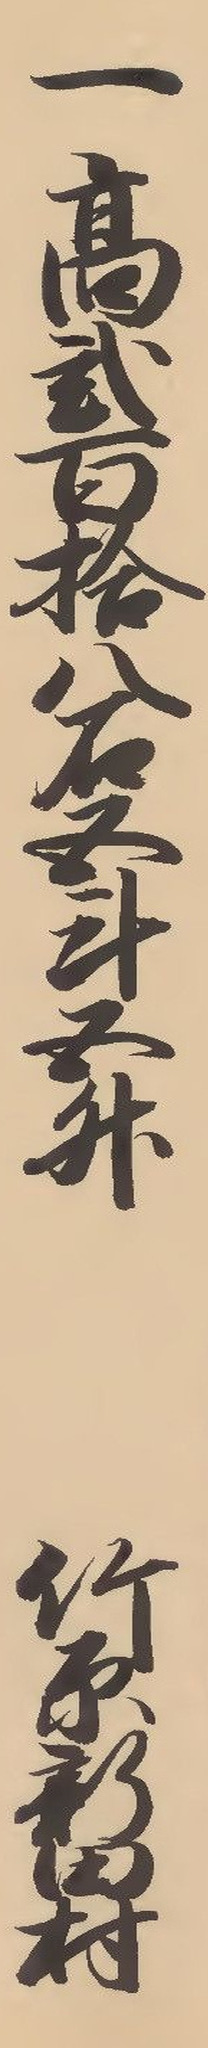一高弐百拾八石五斗五升竹原新田村
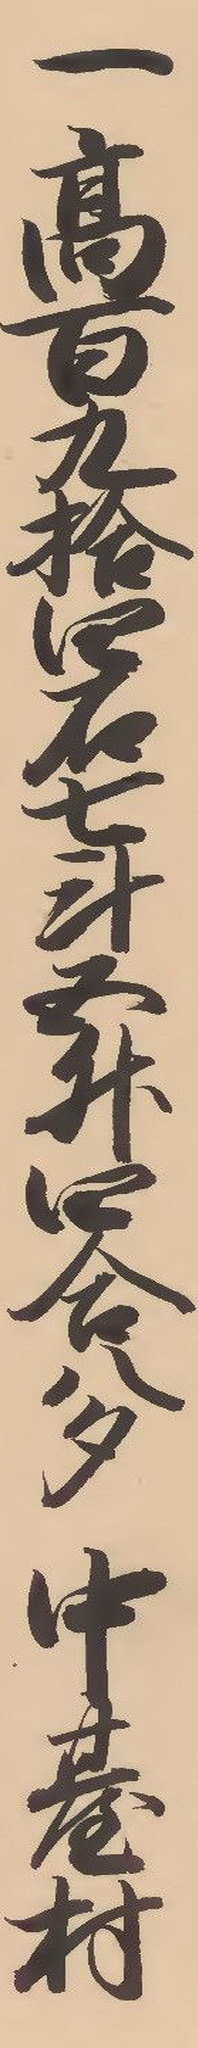一高百九拾四石七斗五升四合八勺中台村
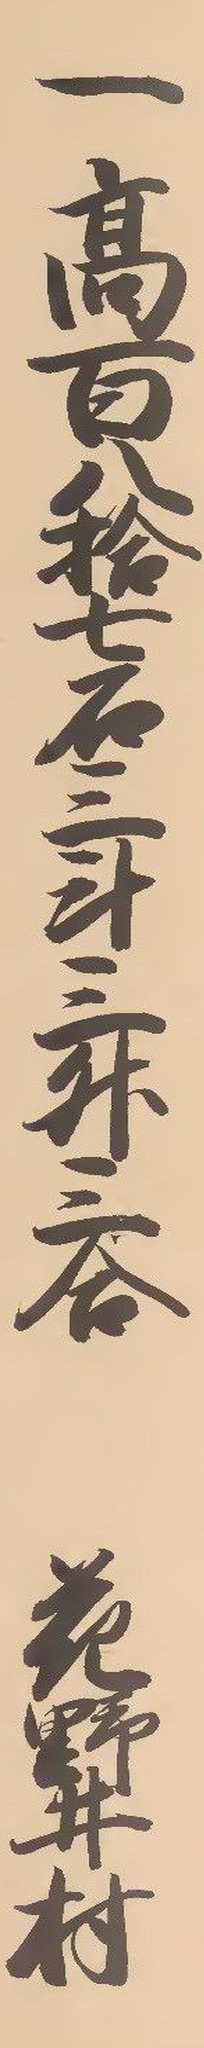一高百八拾七石三斗三升三合花野井村
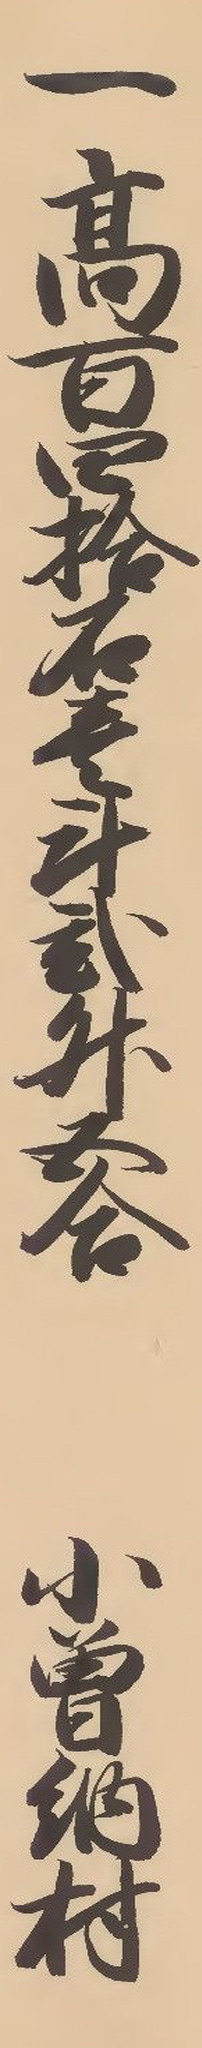一高百四拾石壱斗弐升五合小曽納村
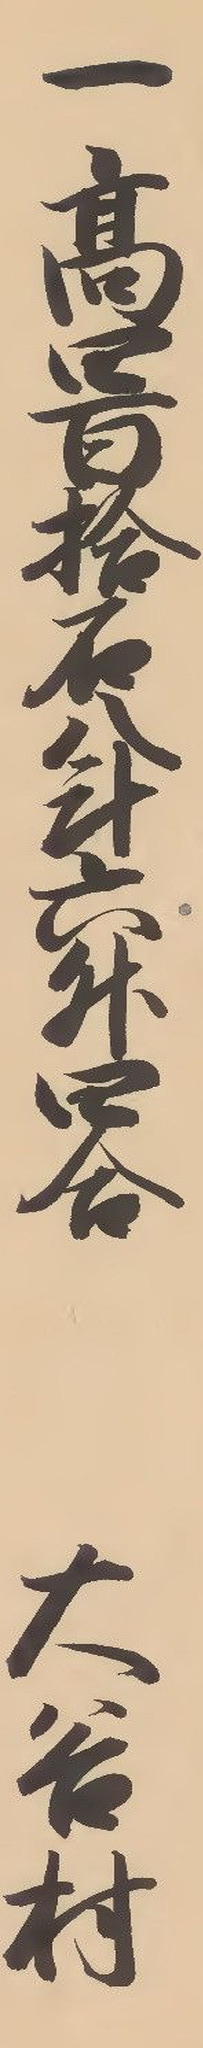一高四百拾石八斗六升四合大谷村
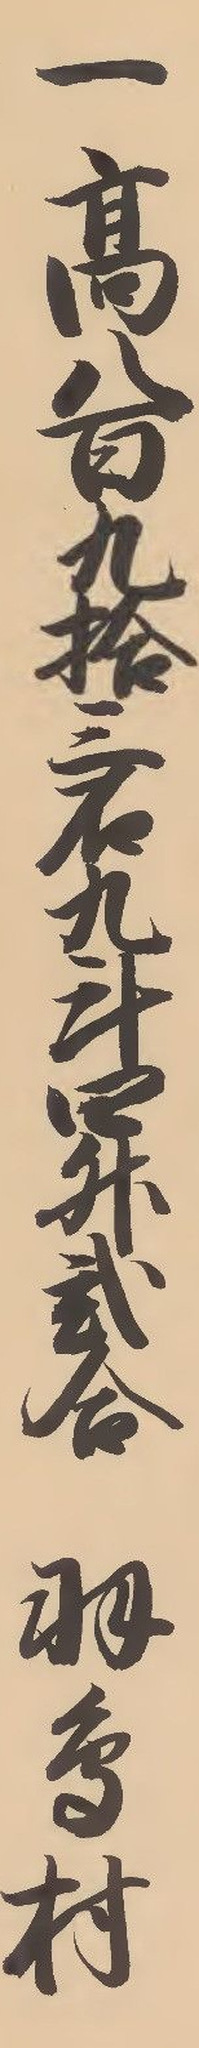一高八百九拾三石九斗四升弐合羽鳥村

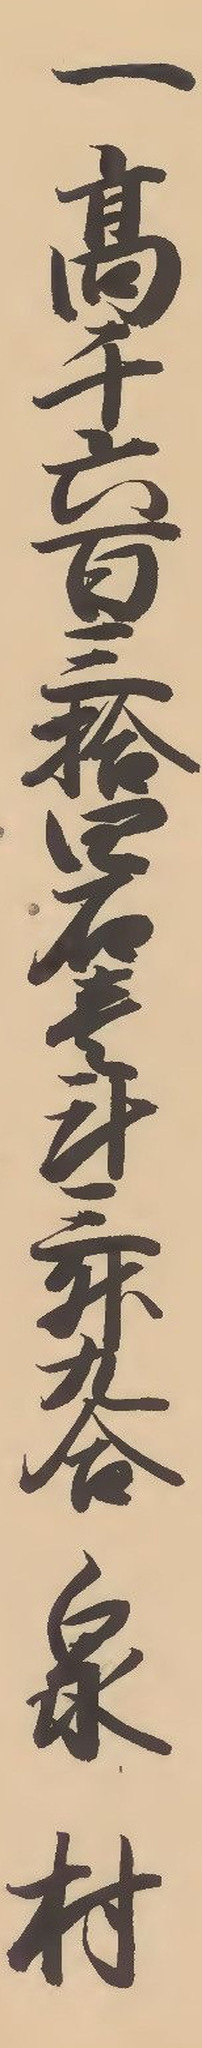一高千六百三拾四石壱斗三升九合泉村
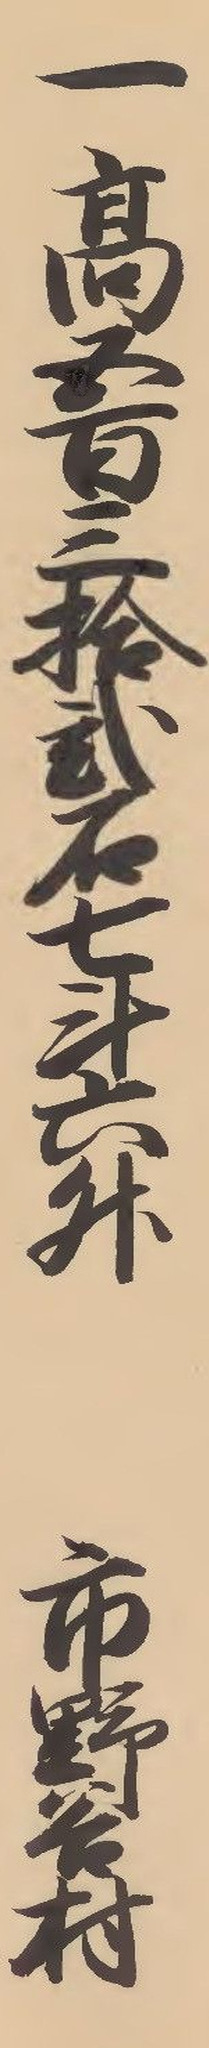一高五百三拾弐石七斗六升市野谷村
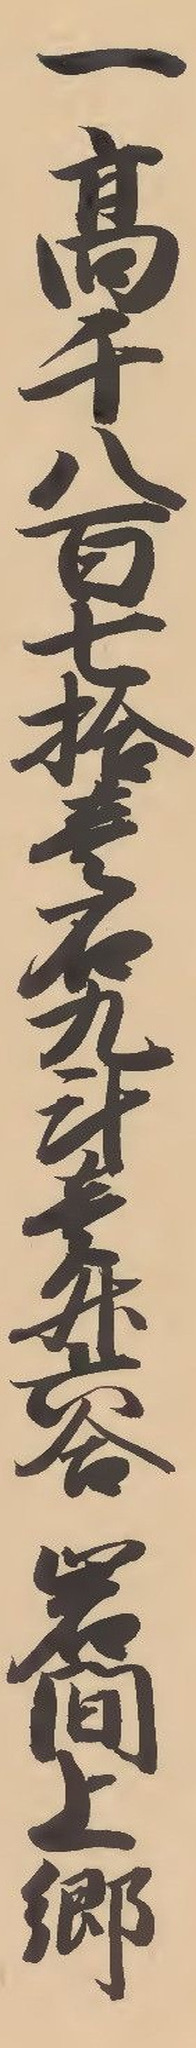一高千八百七拾壱石九斗壱升六合岩間上郷
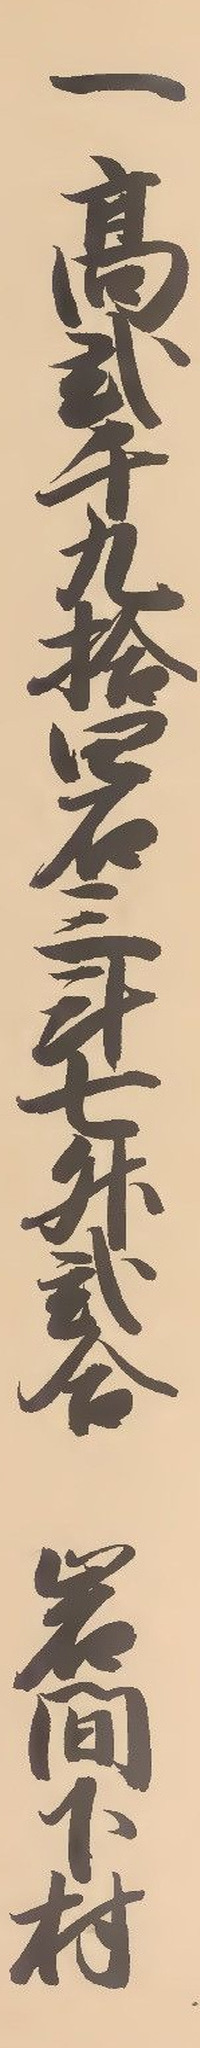一高弐千九拾四石三斗七升弐合岩間下村
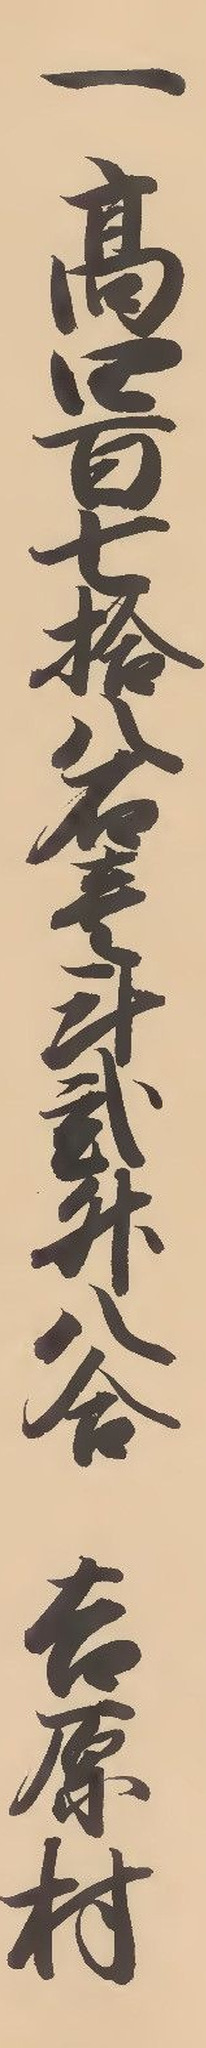一高四百七拾八石壱斗弐升八合吉原村
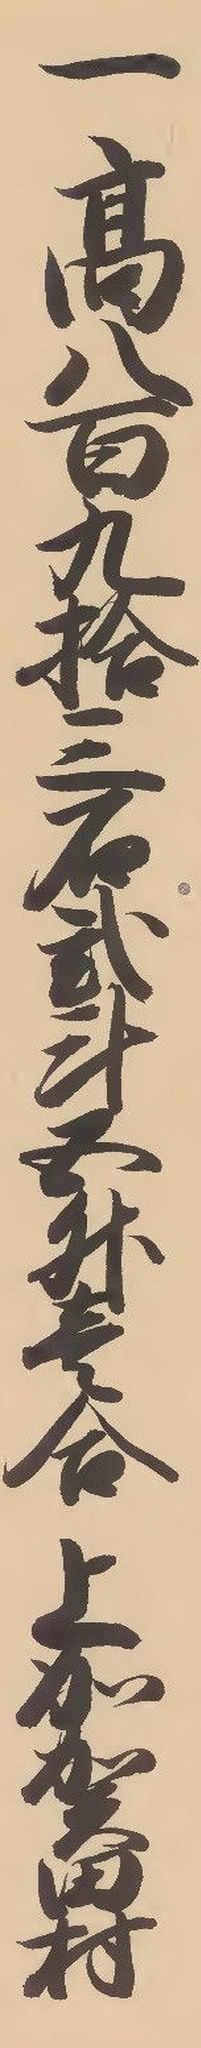一高八百九拾三石弐斗五升壱合上加賀田村
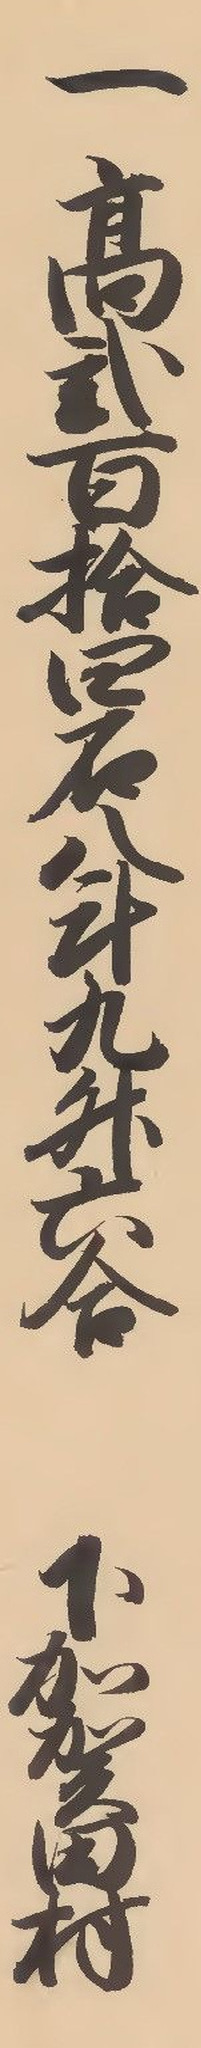一高弐百拾四石八斗九升六合下加賀田村
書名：常陸国郷帳
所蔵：国立公文書館 National Archives of Japan
